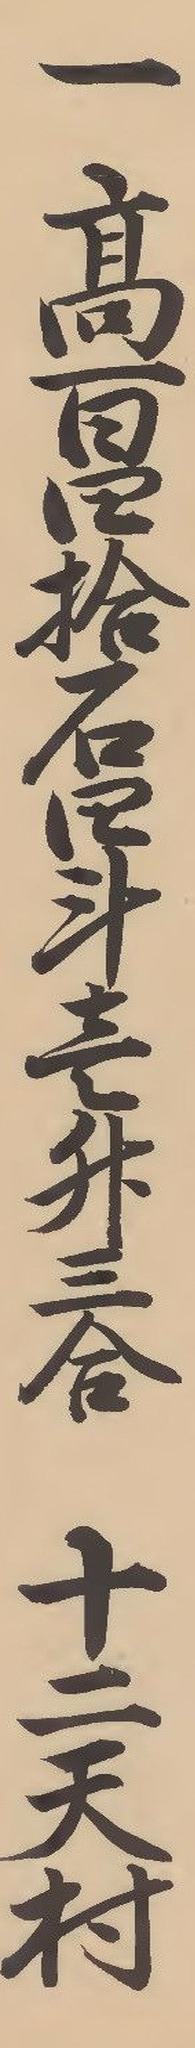一高百四拾石四斗壱升三合十二天村

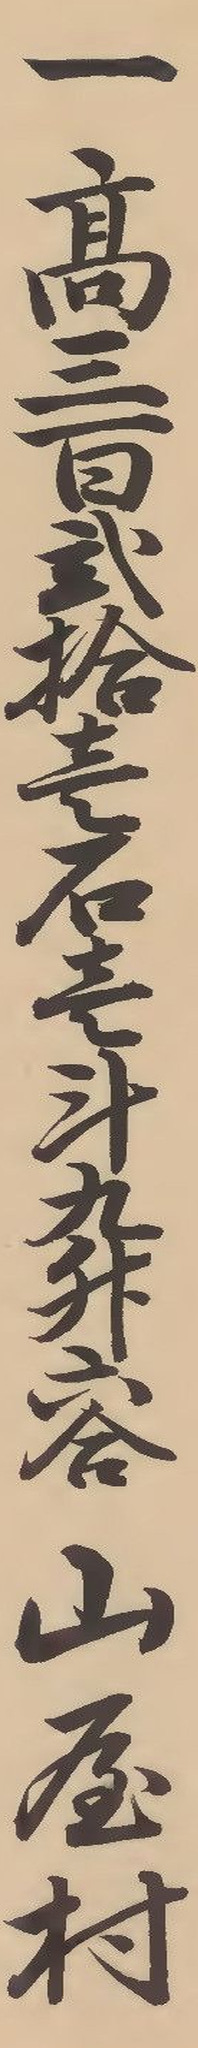一高三百弐拾壱石壱斗九升六合山屋村
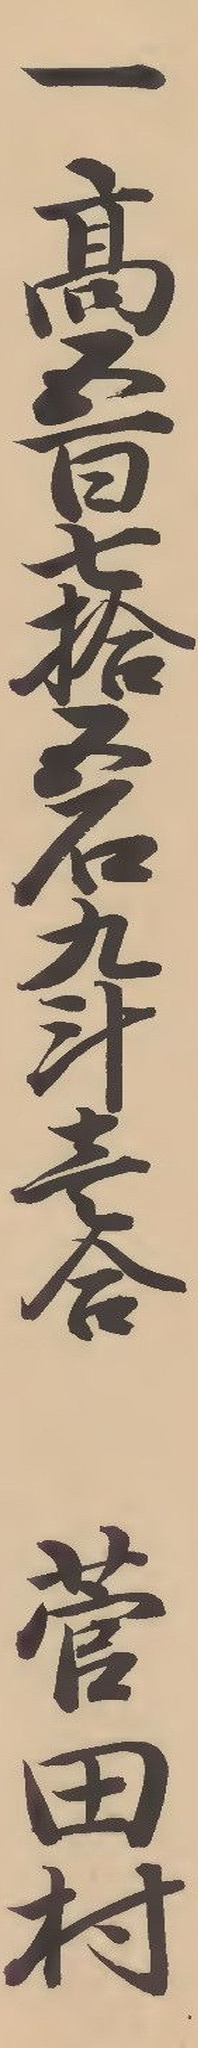一高五百七拾五石九斗壱合菅田村
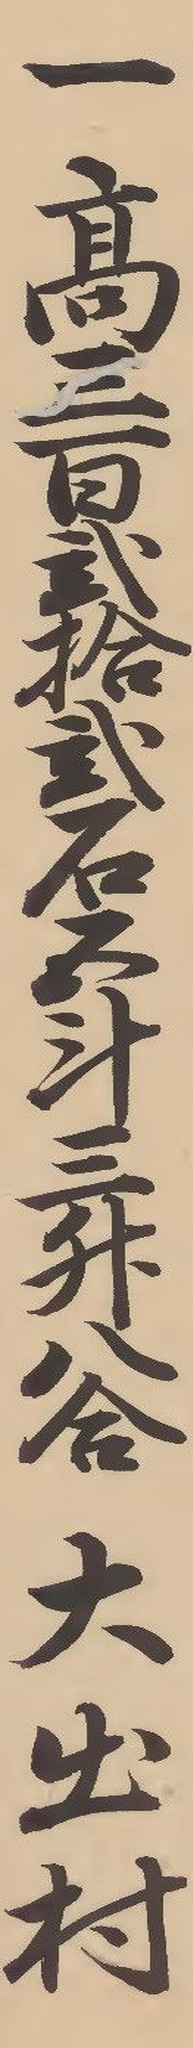一高三百弐拾弐石五斗三升八合大出村
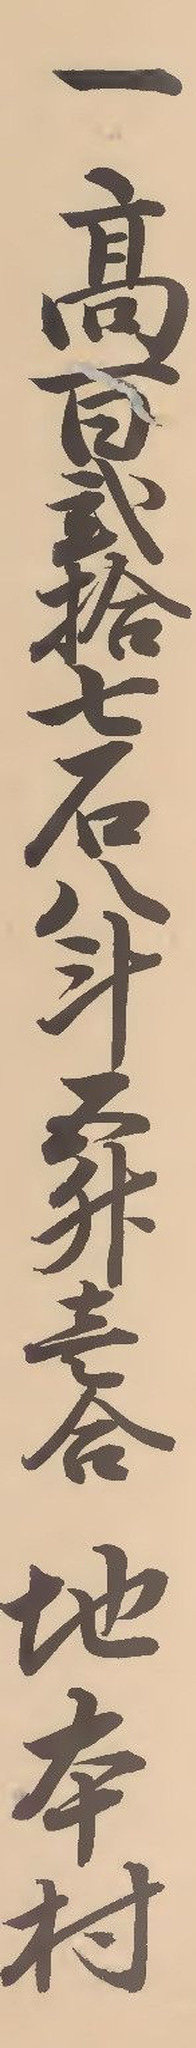一高百弐拾七石八斗五升壱合地本村
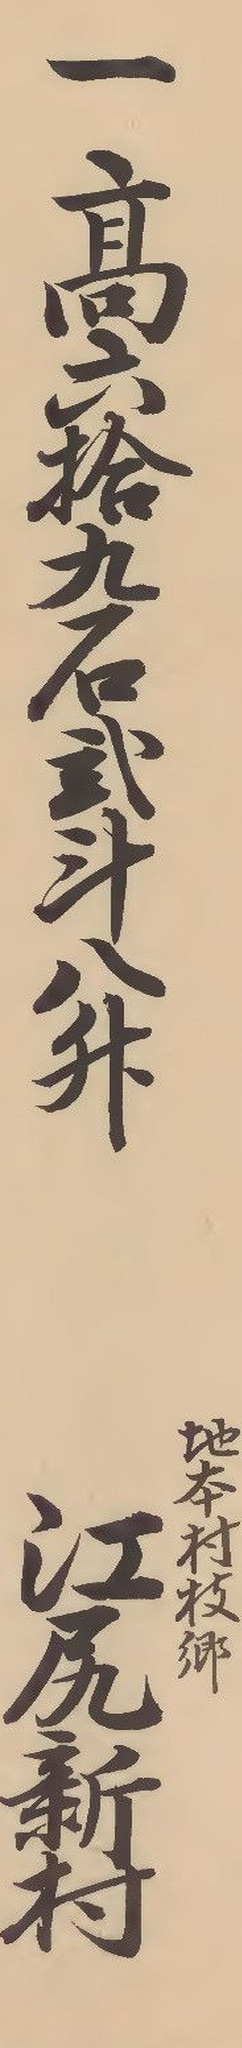一高六拾九石弐斗八升江尻新村
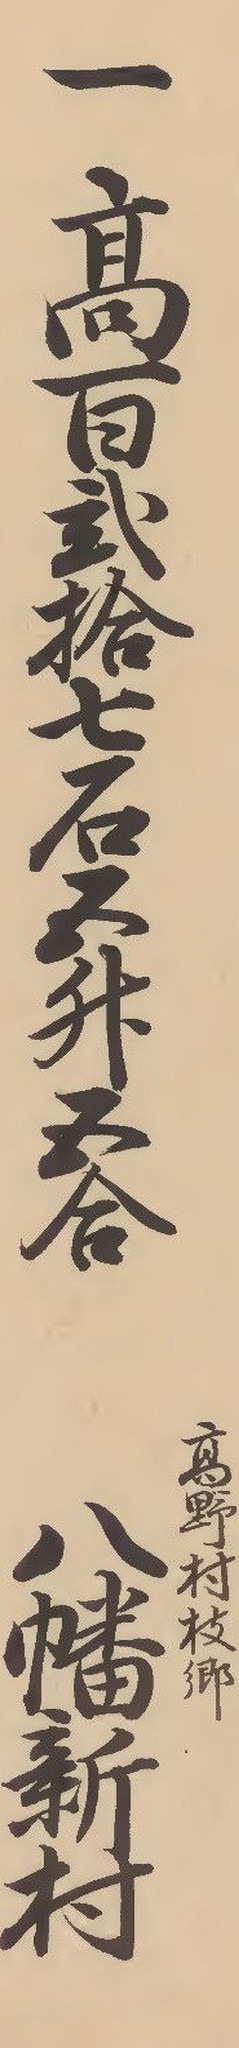一高百弐拾七石五升五合八幡新村

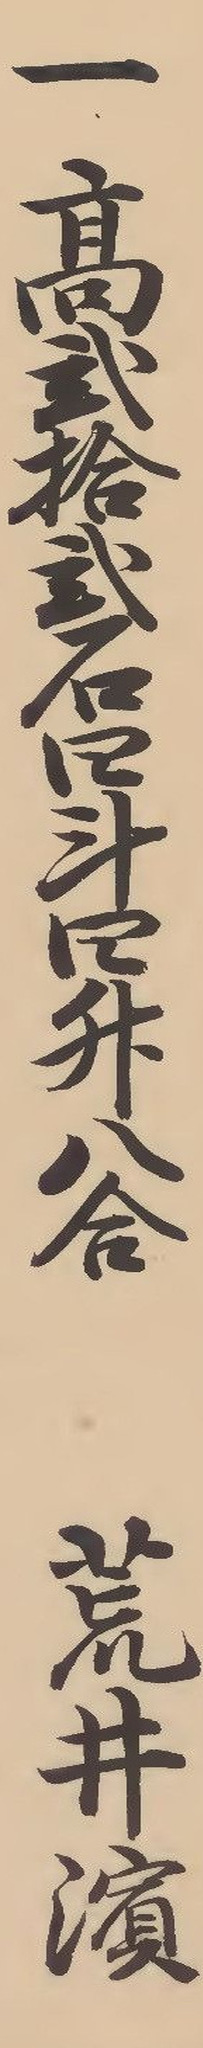一高弐拾弐石四斗四升八合荒井浜
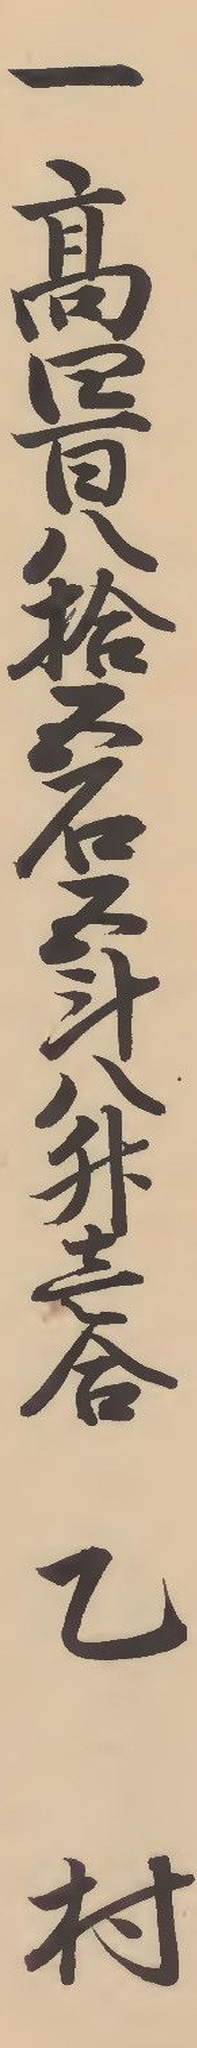一高四百八拾五石五斗八升壱合乙村
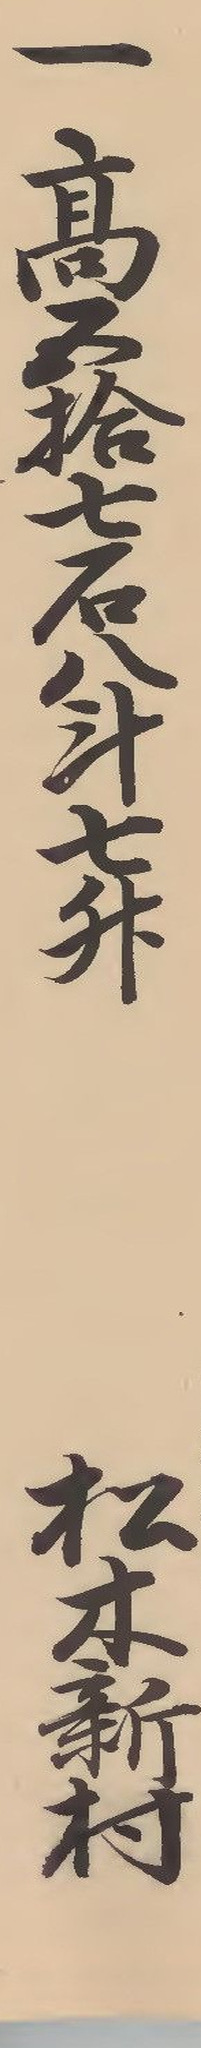一高五拾七石八斗七升松木新村
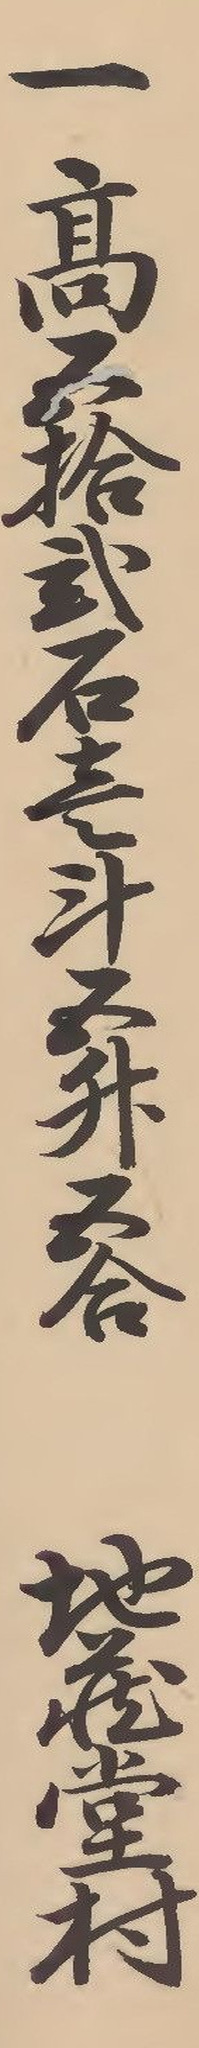一高五拾弐石壱斗五升五合地蔵堂村
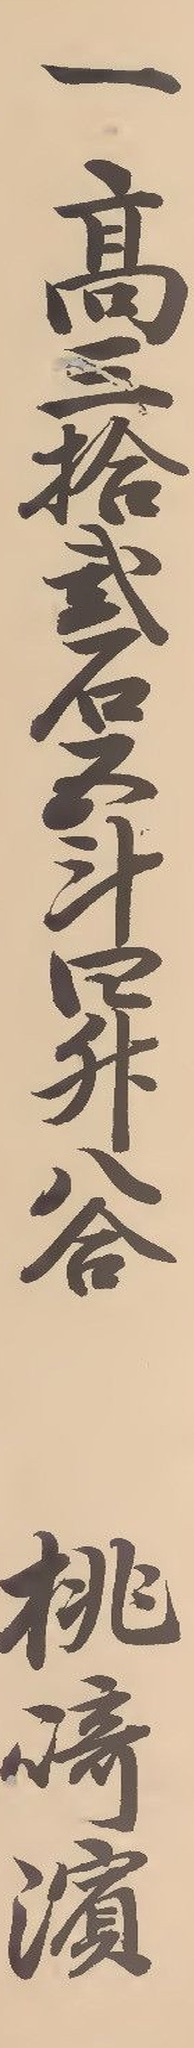一高三拾弐石五斗四升八合桃崎浜
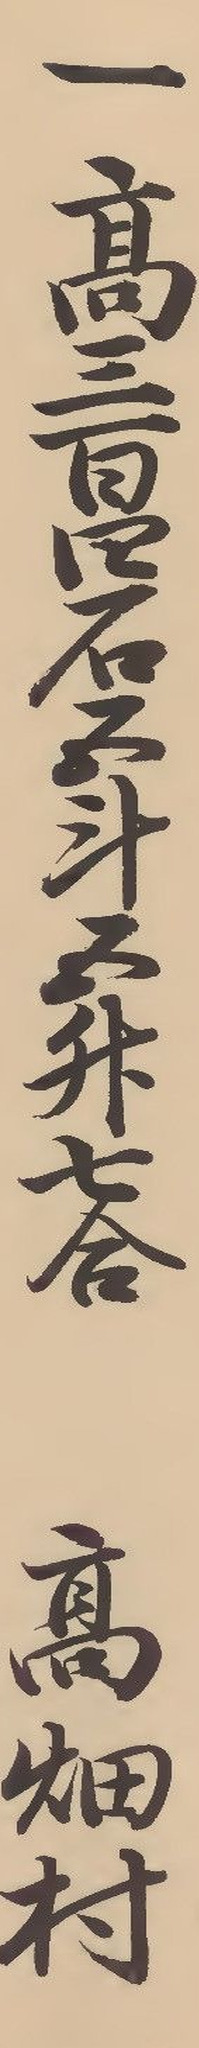一高三百四石五斗五升七合高畑村
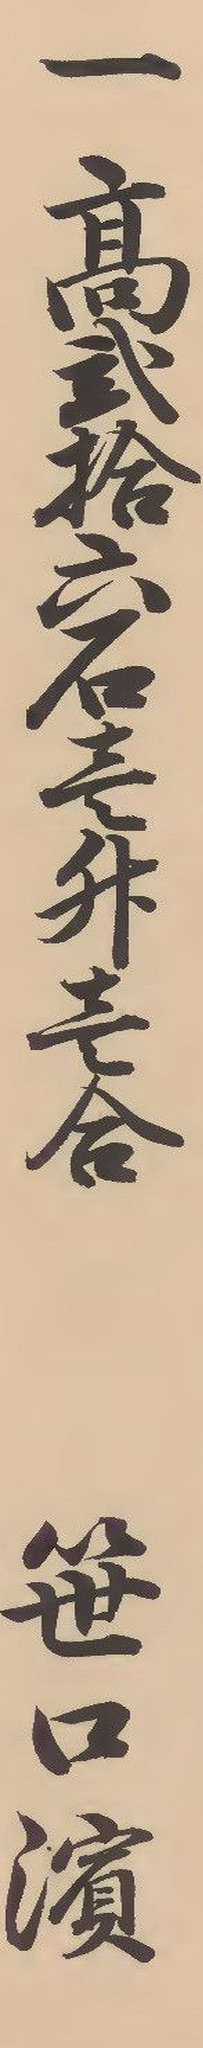一高弐拾六石壱升壱合笹口浜
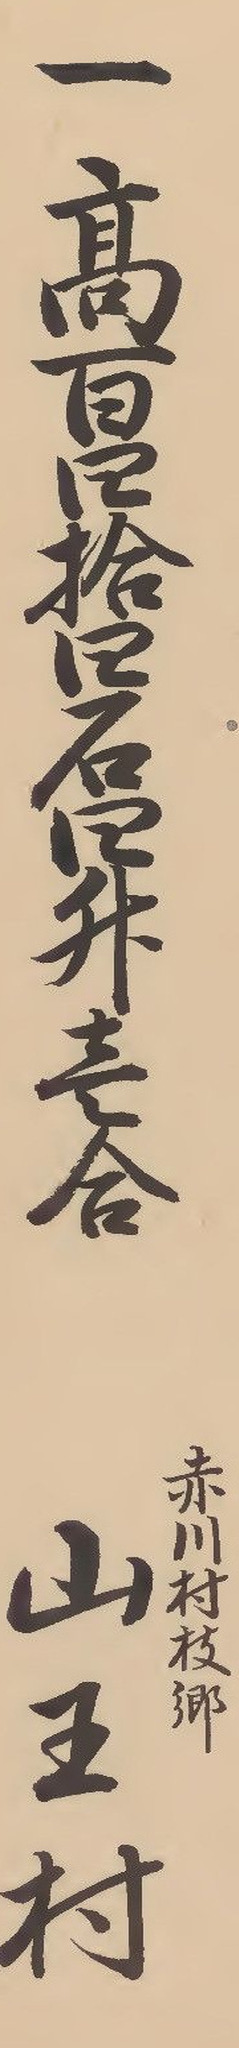一高百四拾四石四升壱合山王村

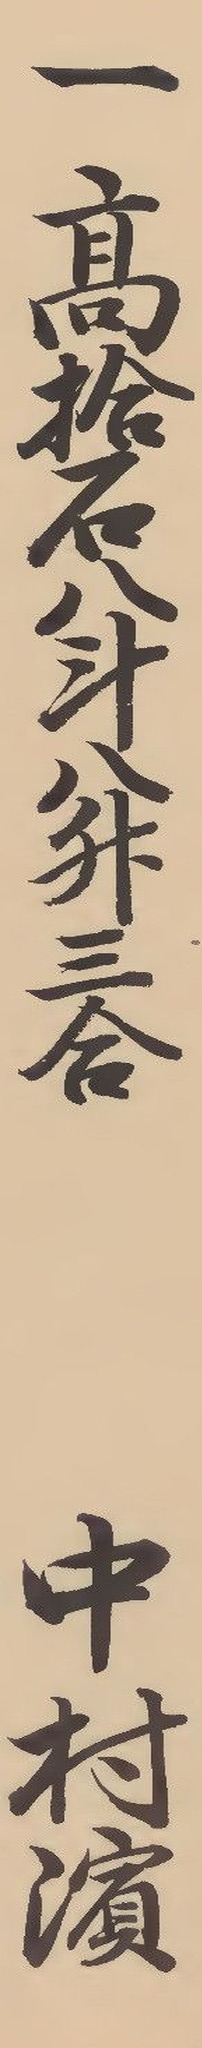一高拾石八斗八升三合中村浜
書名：越後国郷帳　下
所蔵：国立公文書館 National Archives of Japan
